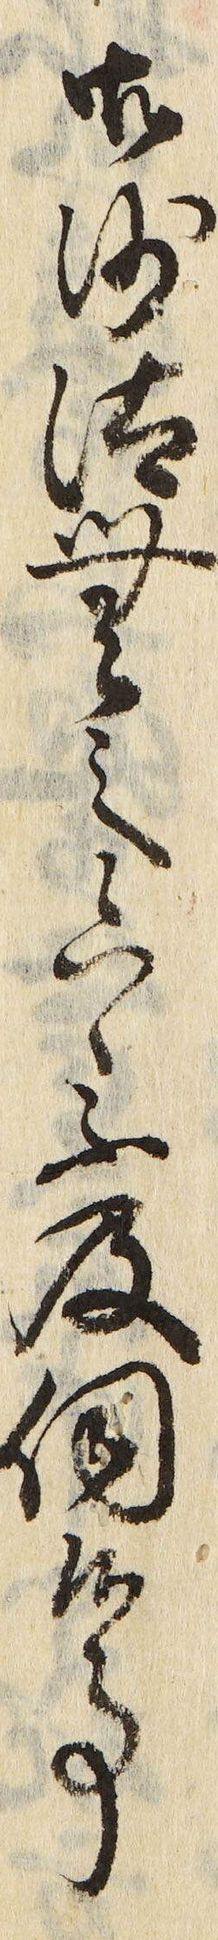御沙汰無之候ハヽ不及伺候事

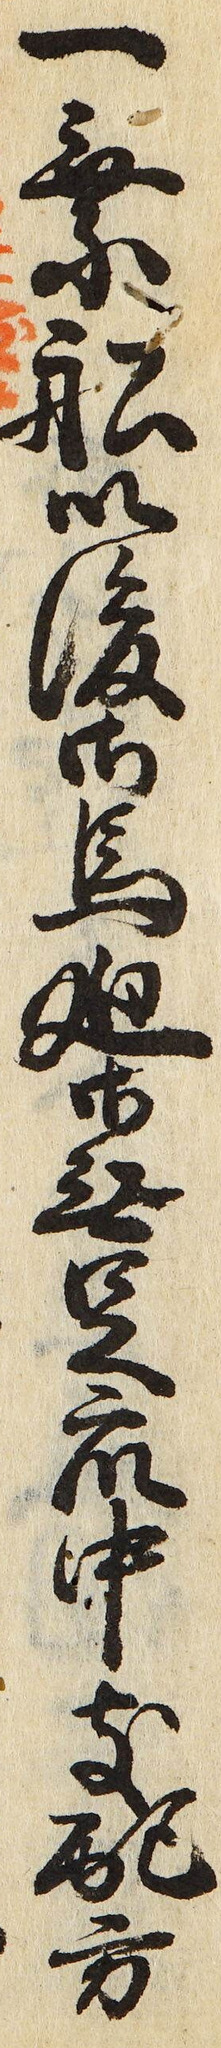一乗船以後御馬廻御無足衆中支配方
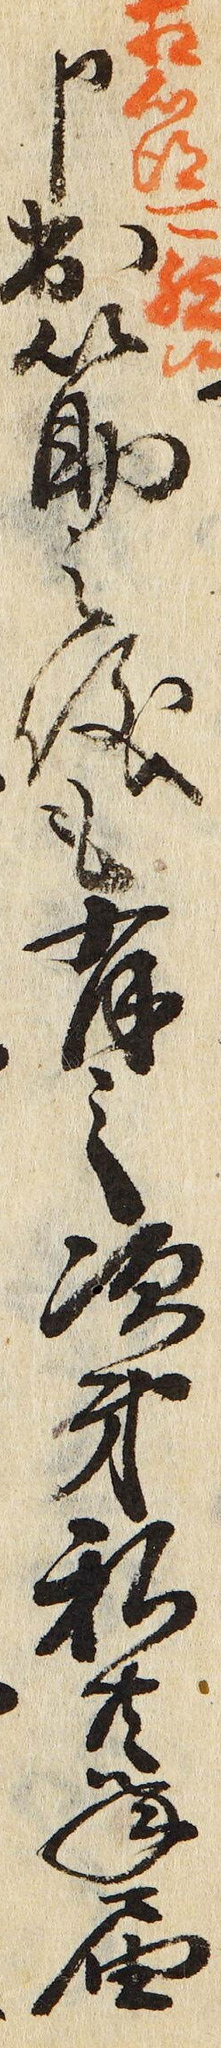申出筋之儀も有之次第私共届
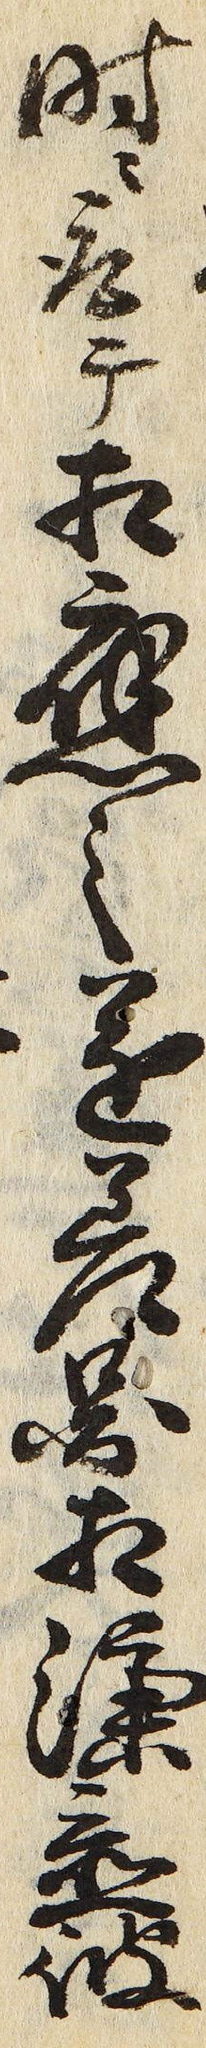時ニ取テ相応之遂差図相済置彼
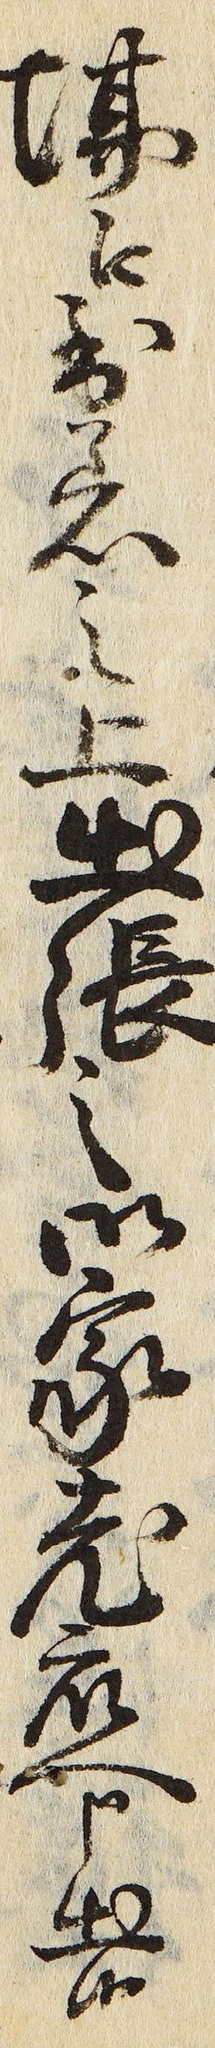場江到着之上出張之御家老衆へ申出候
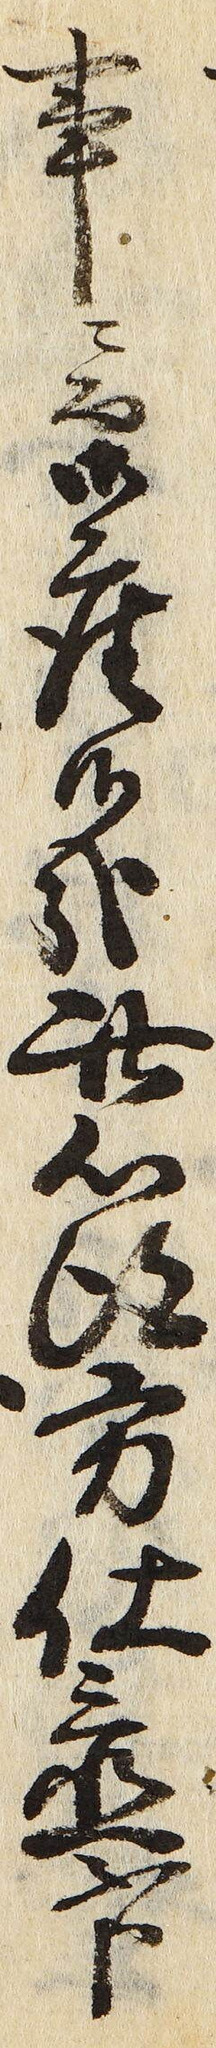事ニ而御座候哉此心得方仕置不申
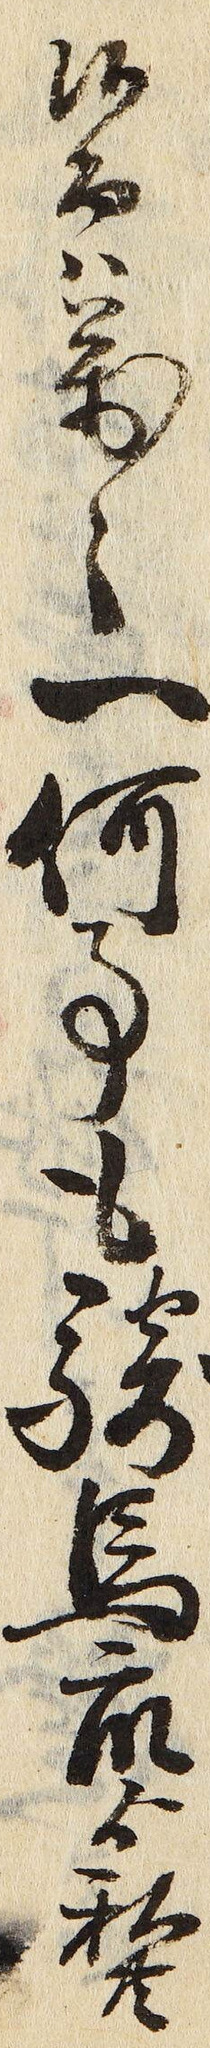候而ハ万々一何事も騎馬衆ゟ私共
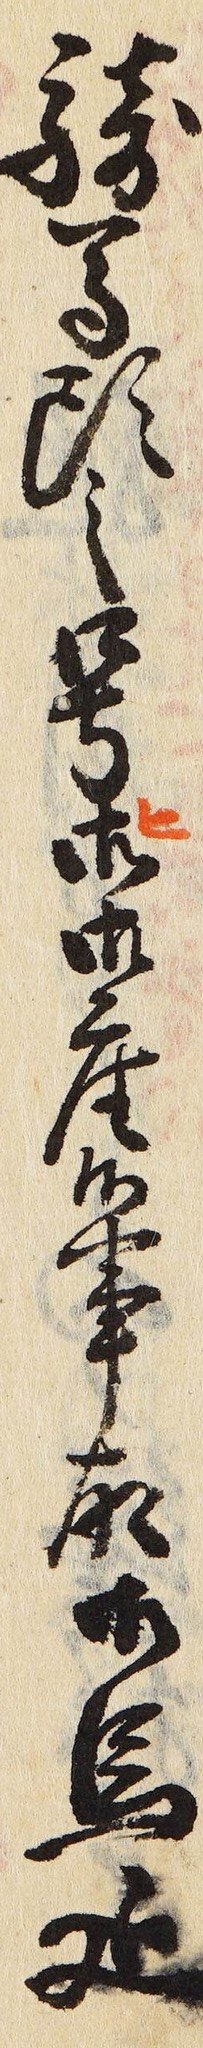騎馬頭之号被御座候事故御馬廻
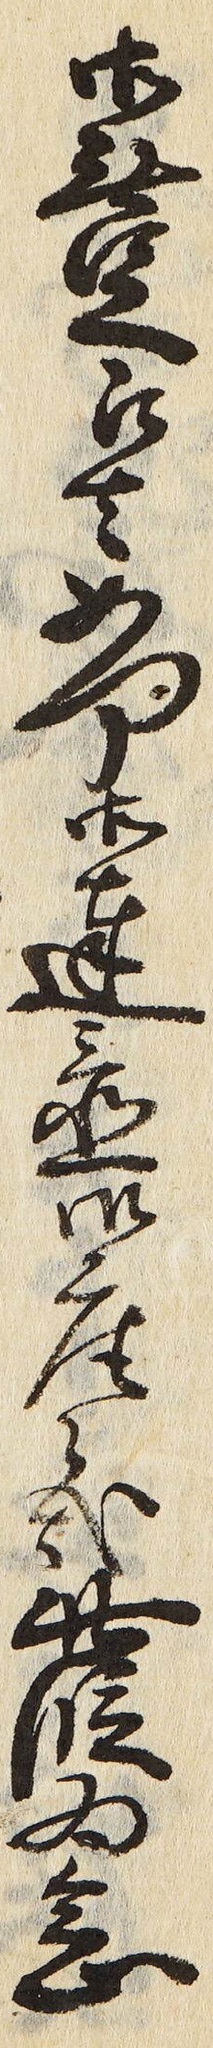御無足江者如何御達置御座候哉此段為念
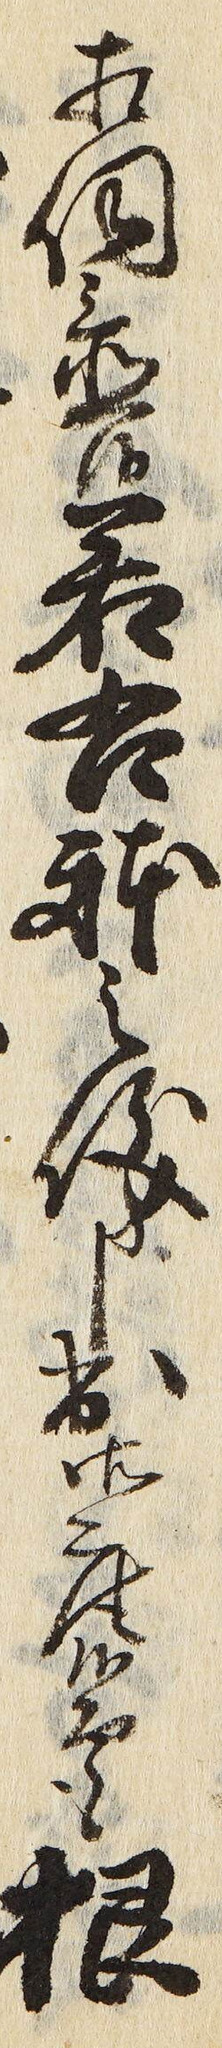相伺置候若右体之儀申出御座候而も根
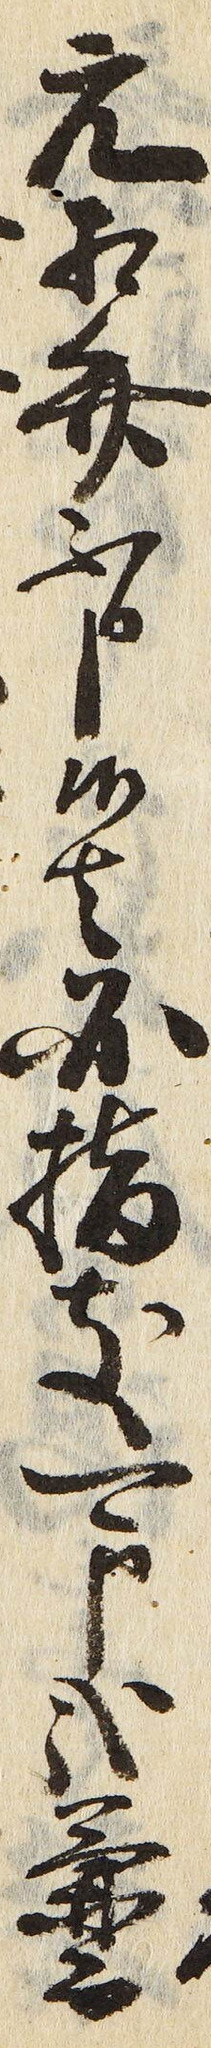元相弁不申候者亦指支可申哉兼而
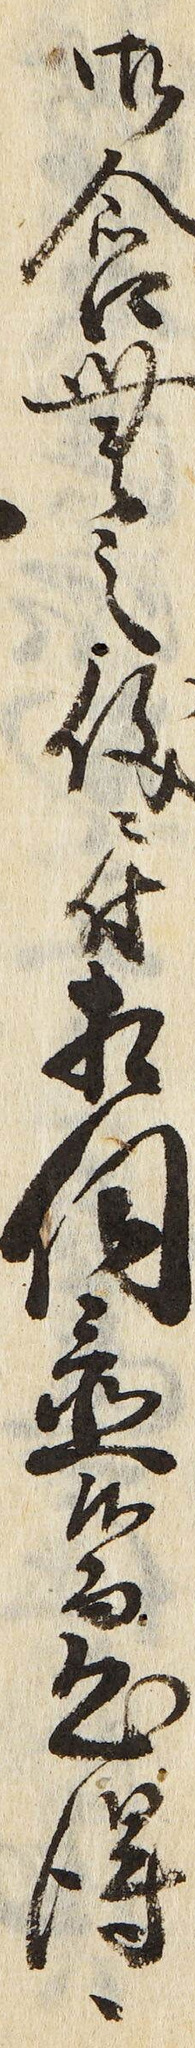御含無之儀ニ付相伺置候而心得
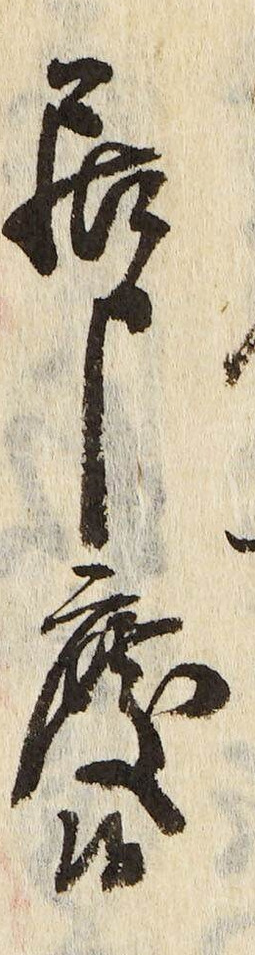居申度候
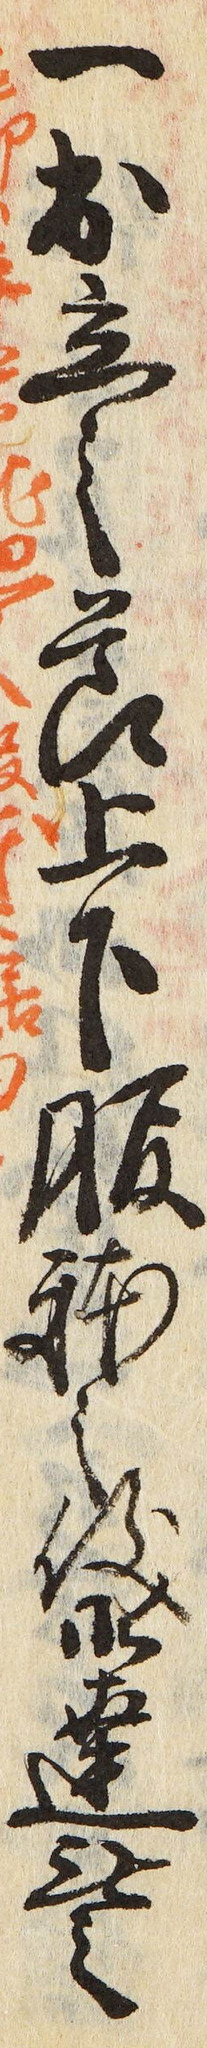一出立之節上下服体之儀御達無之
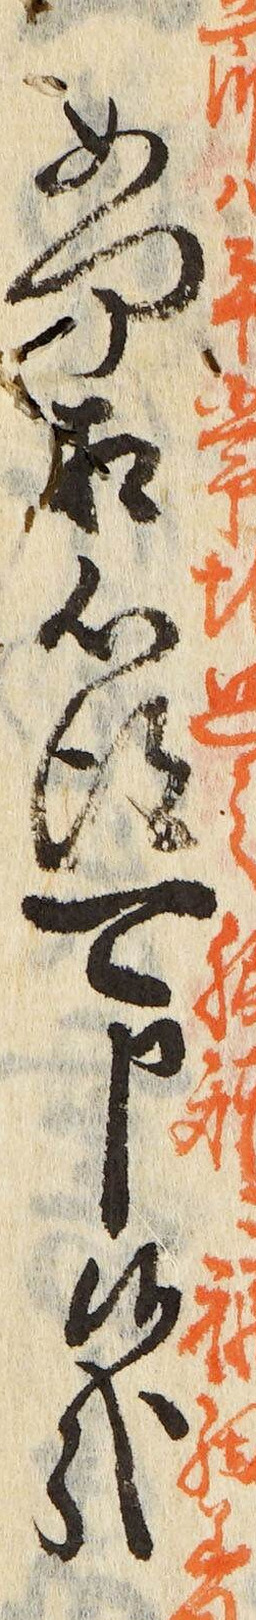如何相心得可申候哉

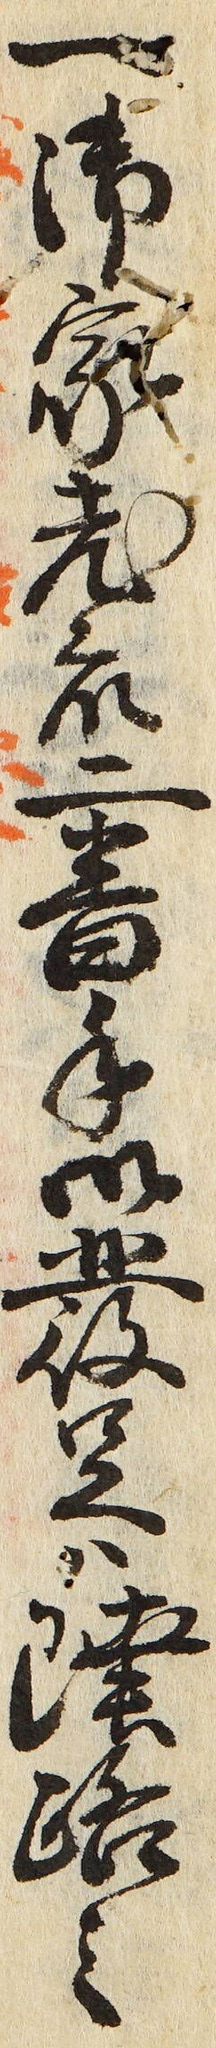一御家老衆二番手御発足ハ陸路之
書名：御領海江異国船漂流有之節御手当之次第大組頭心得之廉々書集記
